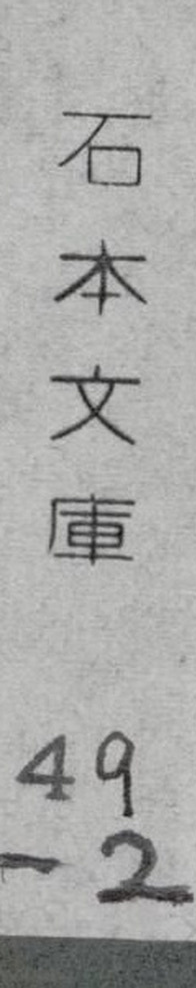石本文庫-
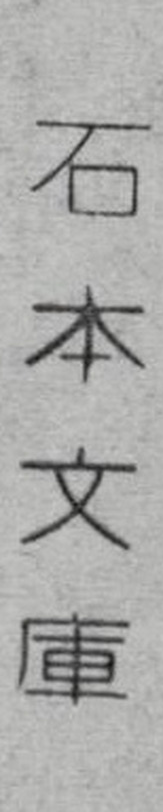石本文庫-
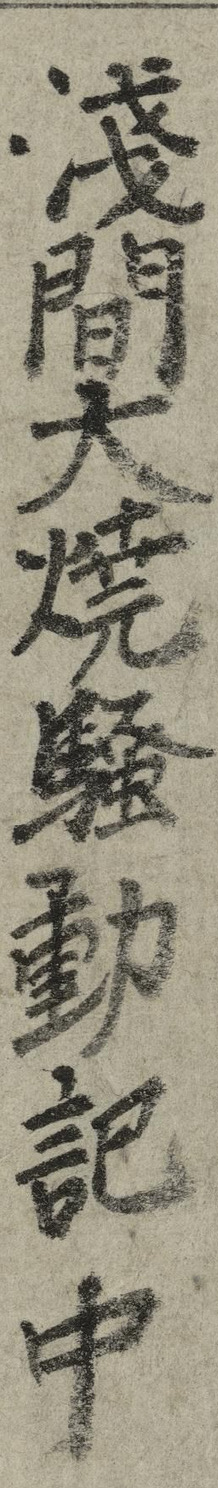浅間大焼騒動記中

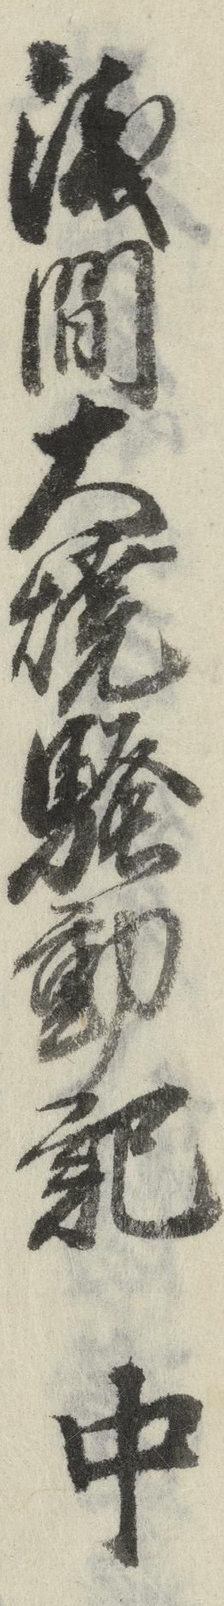浅間大焼騒動記中
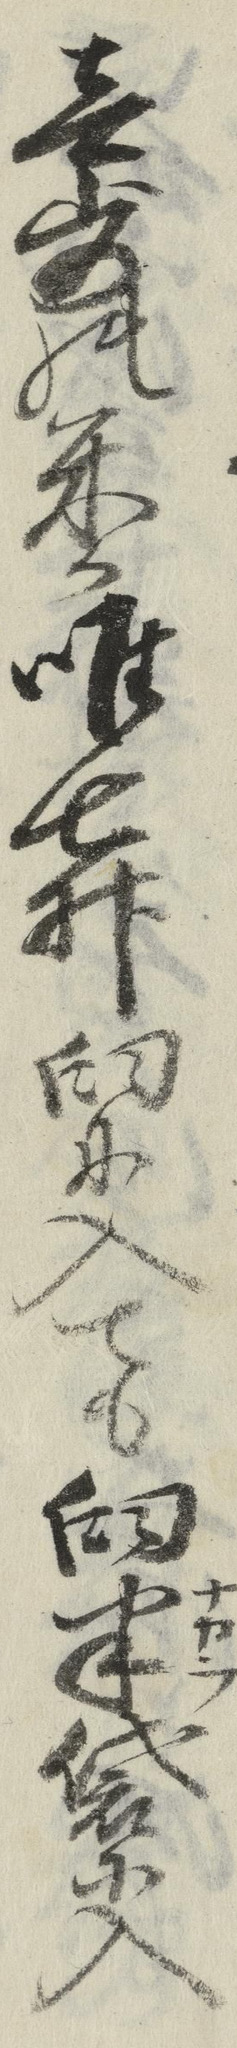壱歩の米か唯七升臼に入ても臼半袋に入
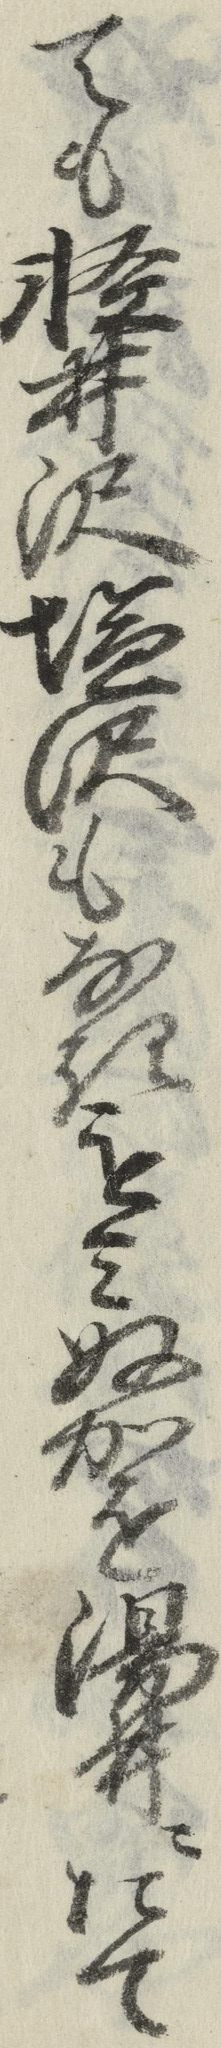ても軽井沢塩沢もなきもみぬかを湯井にたて
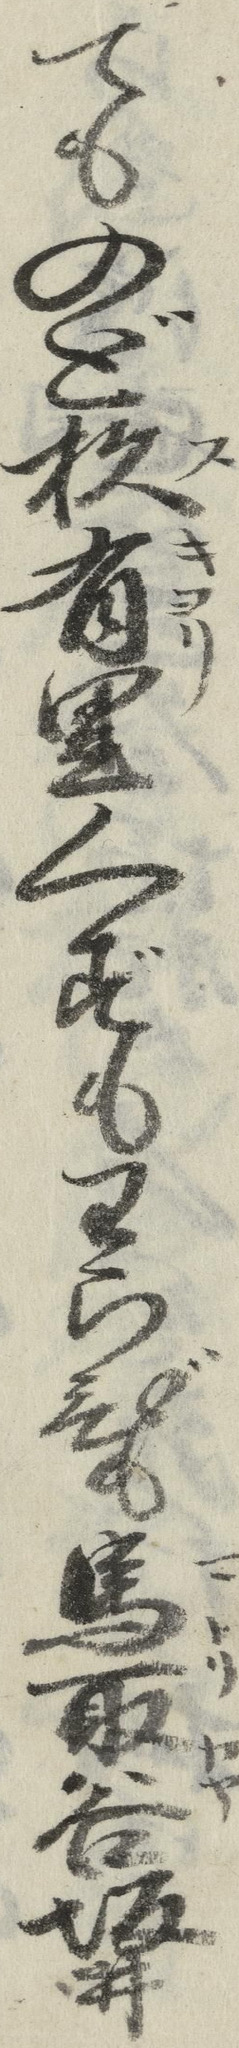てものど杦有里くずもわらびも馬取谷坂井
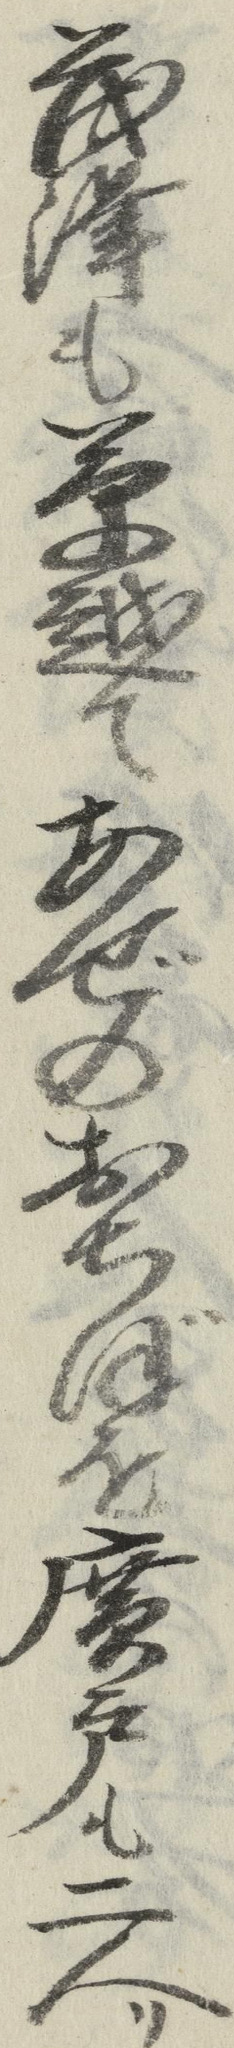茂澤も草越てあぜのおちばを廣戸も二人
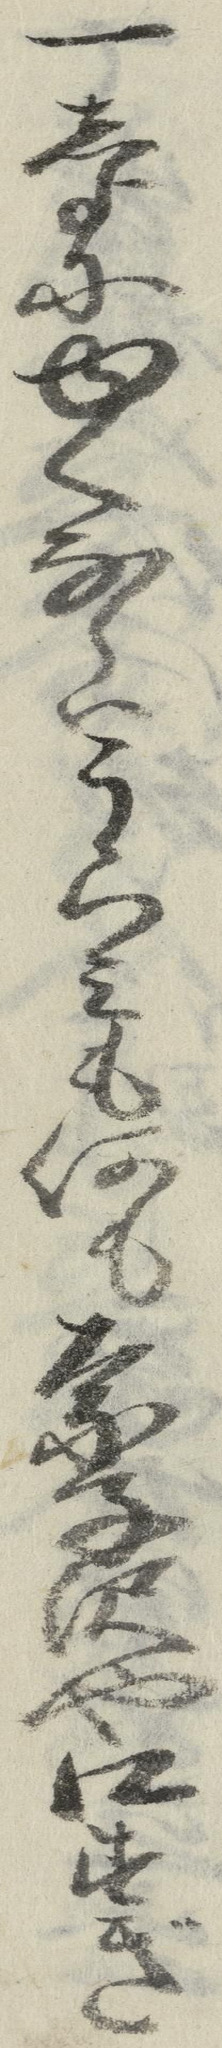一しよにゆくならはうらみも何も奈子沢や口すぎ
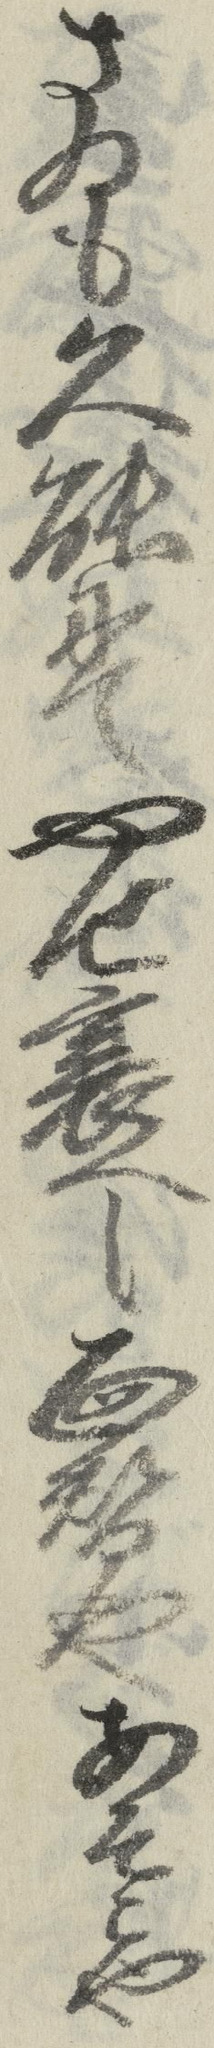さゐも久能にてやせ衰へし面替やあそこや

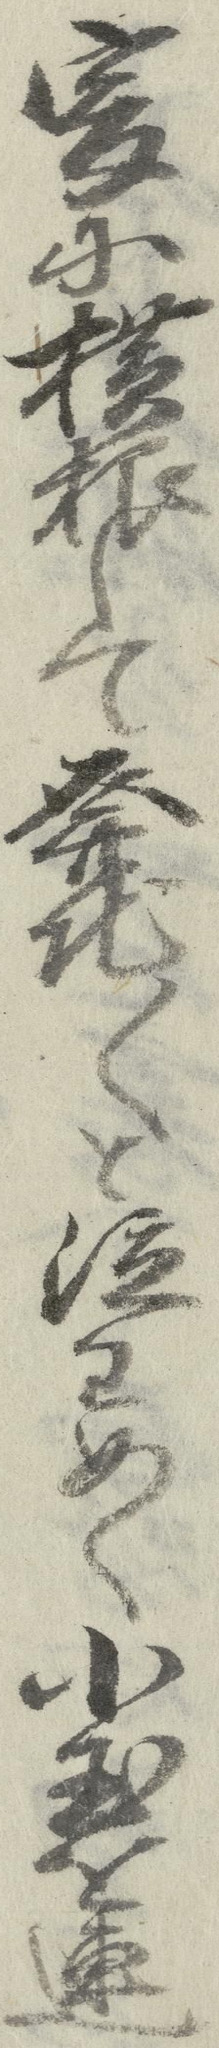爰に横根して発地〳〵と泣わめく小玉を連
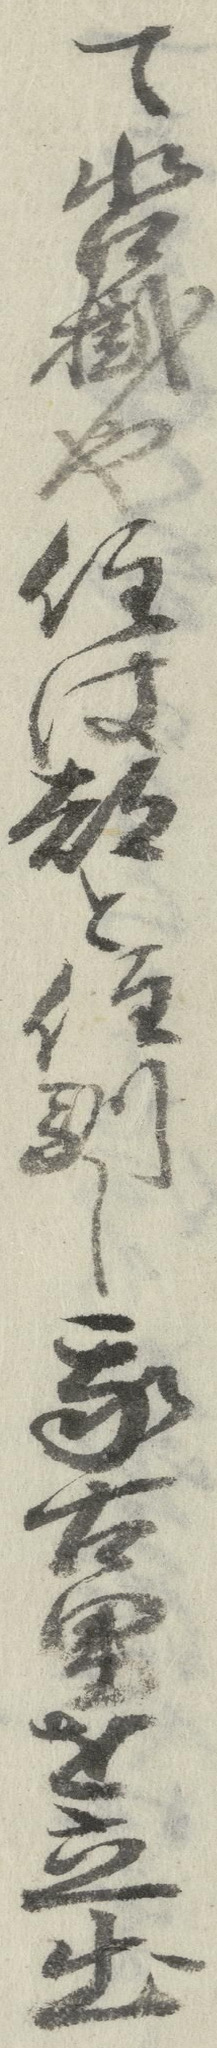て沓掛や住は都と住馴し我古里を立出
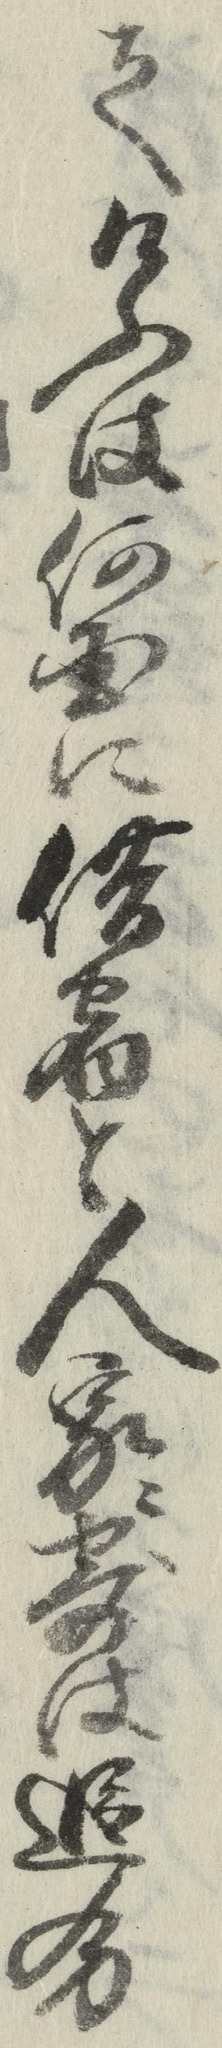てけふは何国に借宿と人家に寄は追分
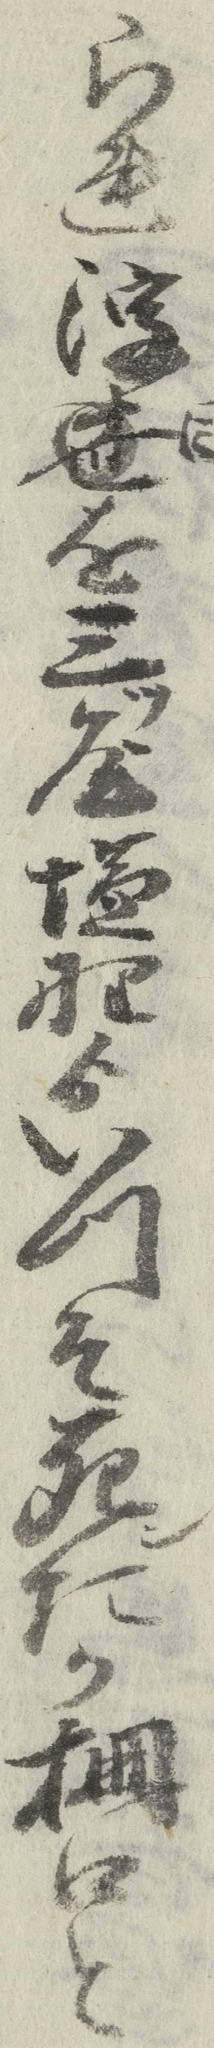られ浮目を三屋塩野ゟいつそ死柵口と
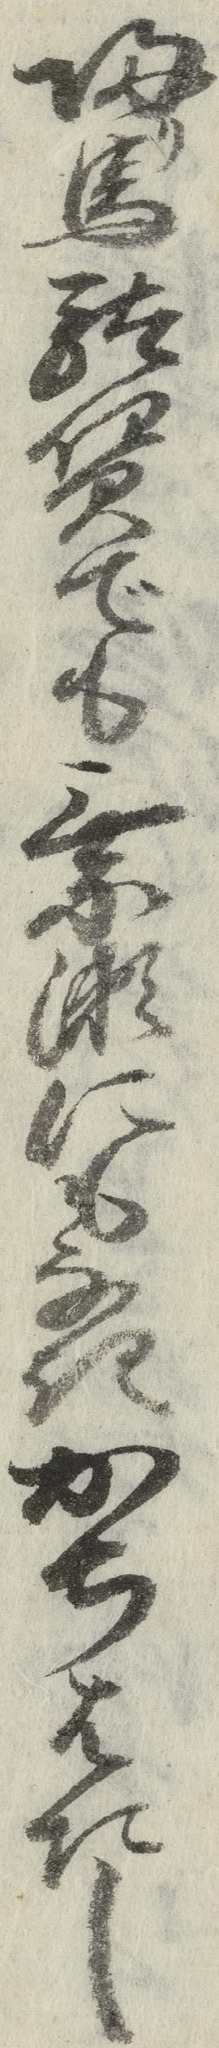帰馬駄賃でも乗瀬にもなきかちはたし
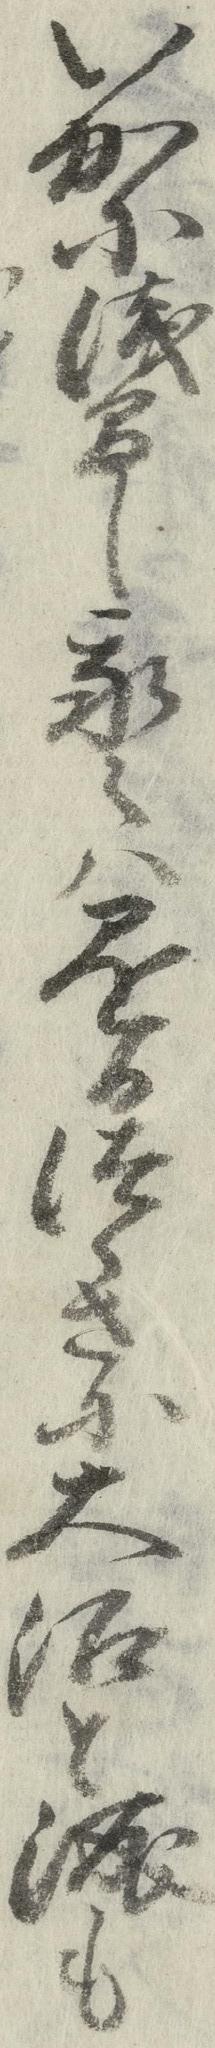いかに浅間し我々は懸るつらさに大沼と涙も
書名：浅間大焼騒動記　中
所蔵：東京大学地震研究所図書室 Earthquake Research Institute Library, The University of Tokyo, JAPAN
